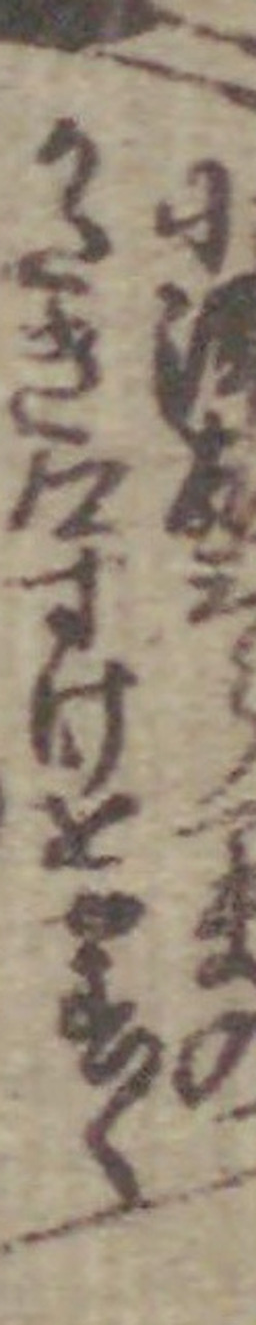かたき郷すけをやす〳〵
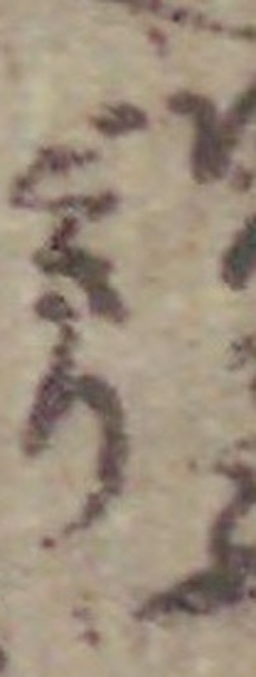ごさり
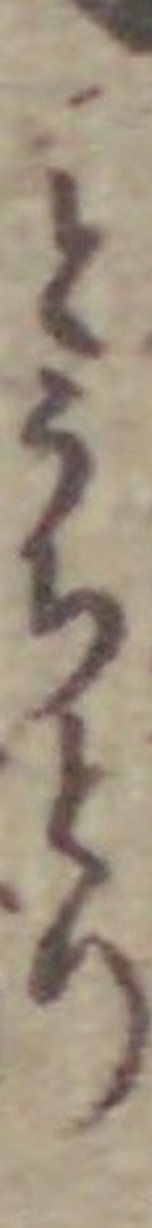とうちとり
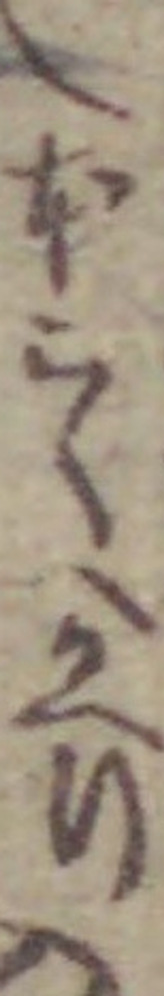本こくへかへり
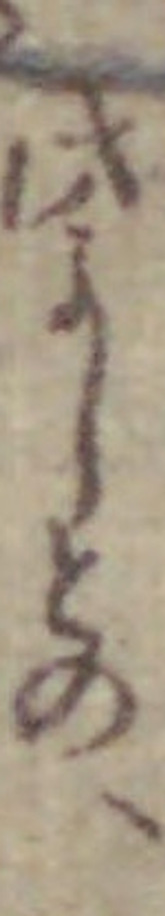此よしとのへ
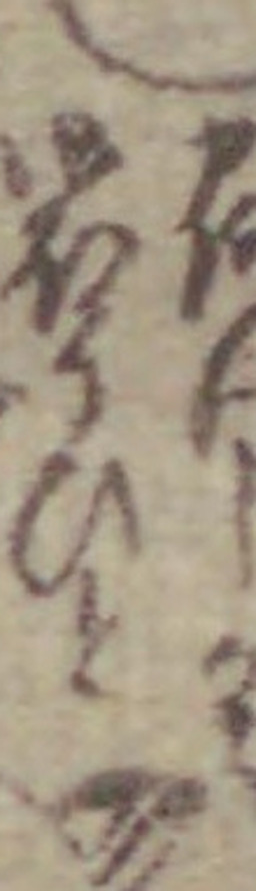御ほうひと
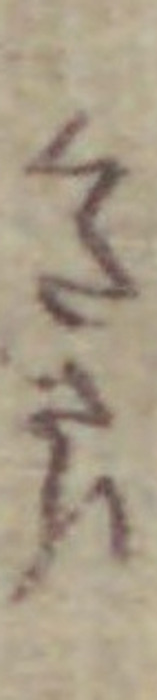くたされ
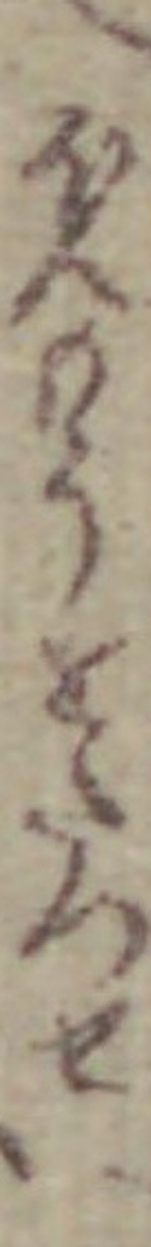ほんもうをたつせ
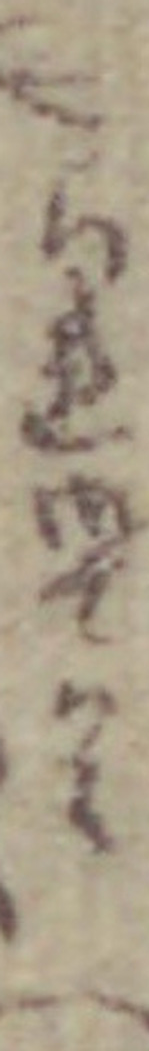られ御てから
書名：化物一家髭女 2巻
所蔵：国立国会図書館 National Diet Library, JAPAN
